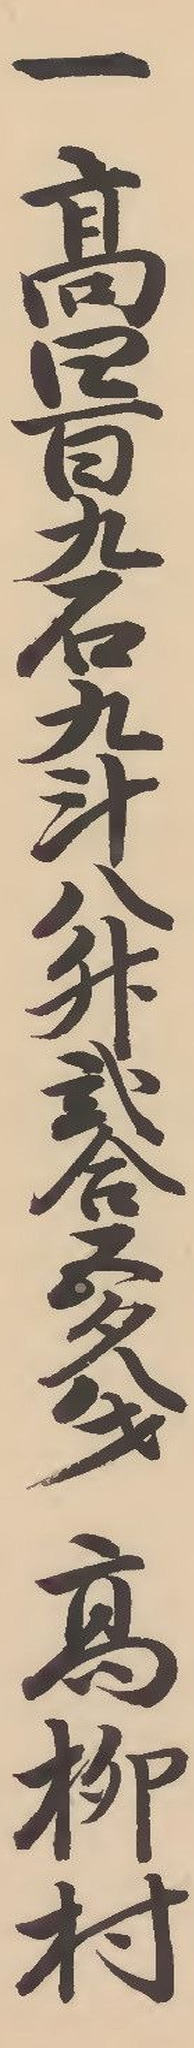一高四百九石九斗八升弐合五勺八才高柳村

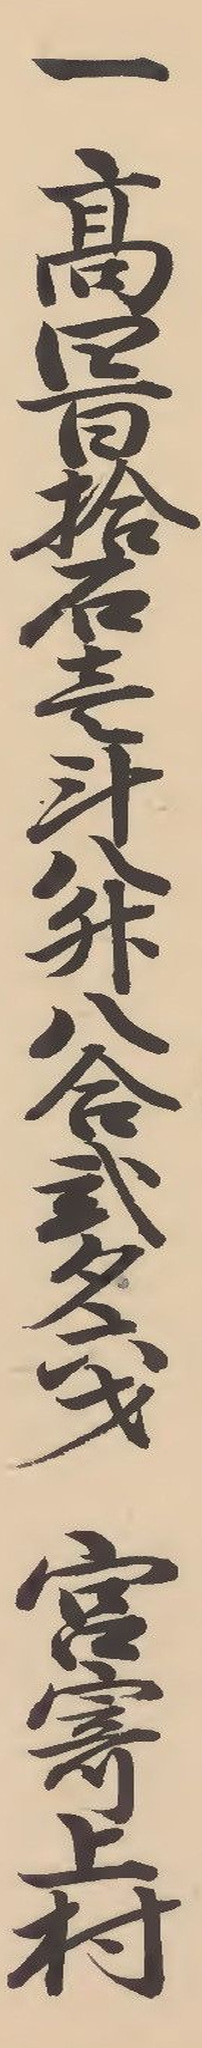一高四百拾石壱斗八升八合弐勺六才宮寄上村
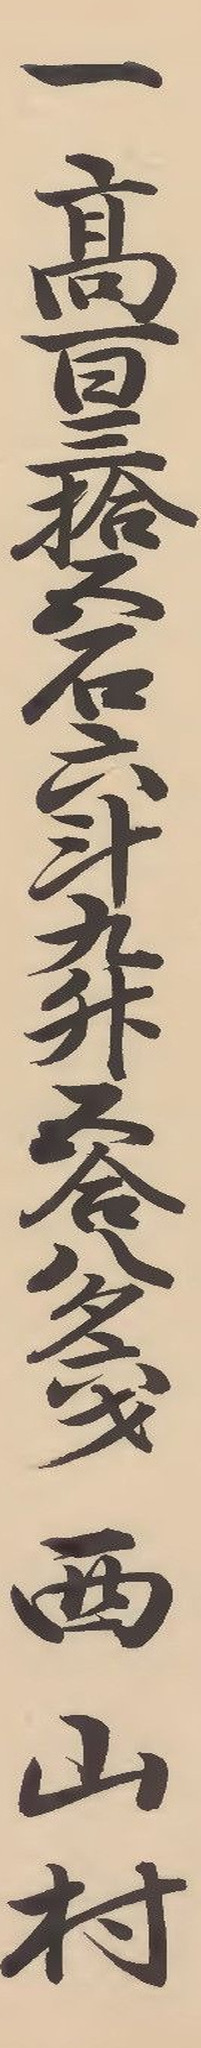一高百三拾五石六斗九升五合八勺六才西山村
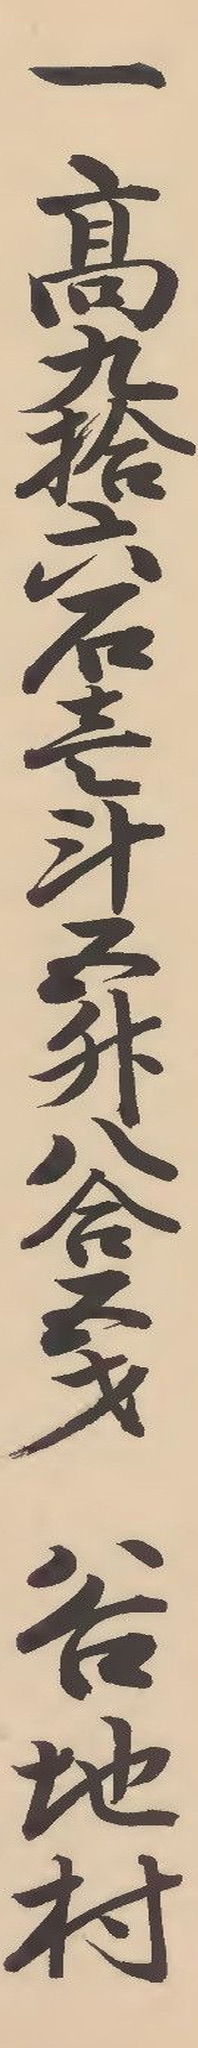一高九拾六石壱斗五升八合五才谷地村
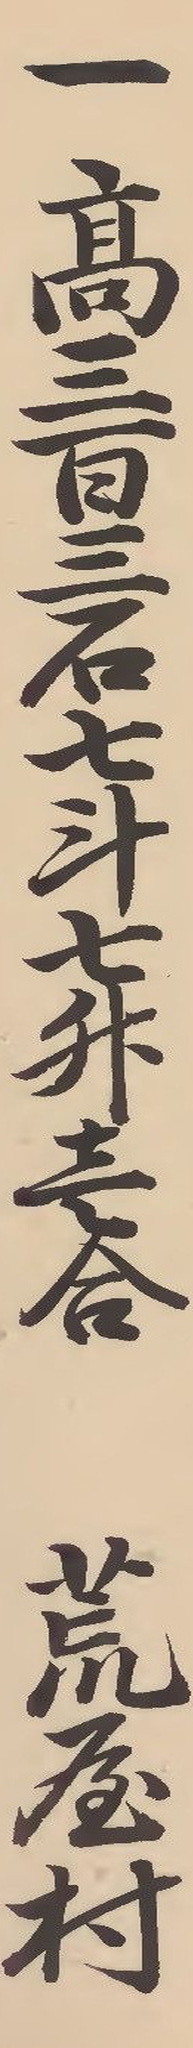一高三百三石七斗七升壱合荒屋村
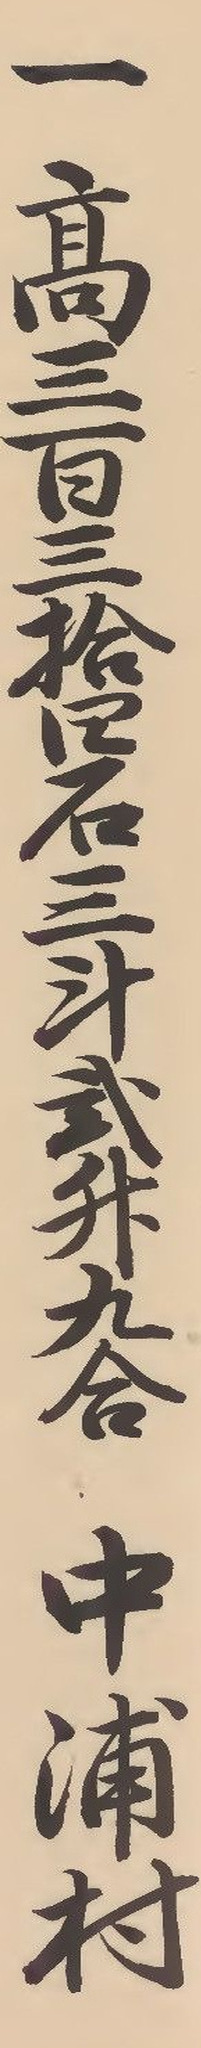一高三百三拾四石三斗弐升九合中浦村
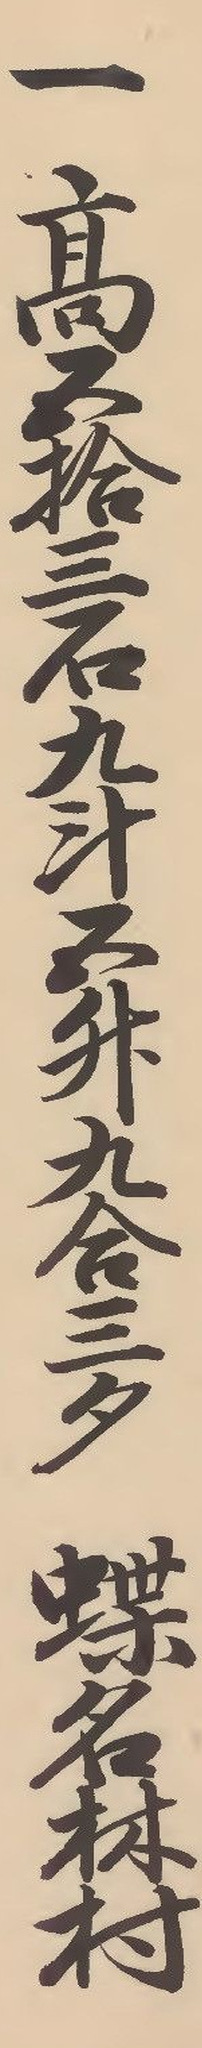一高五拾三石九斗五升九合三勺蝶名林村
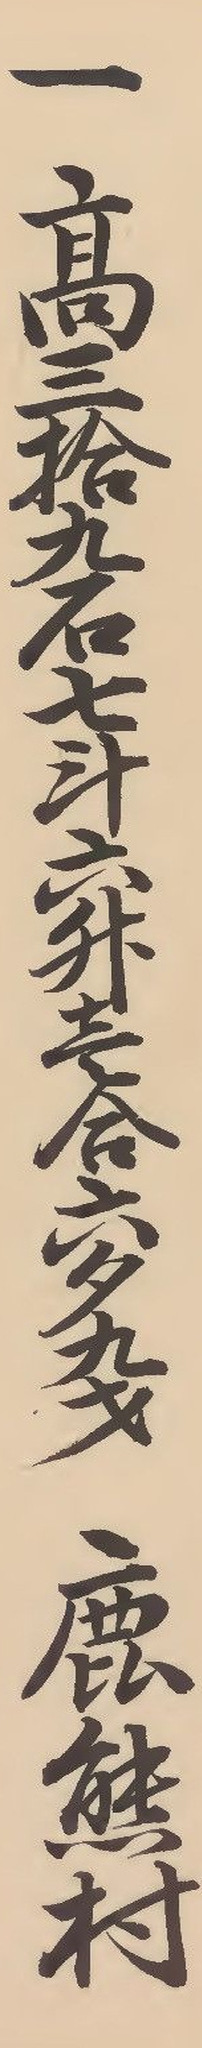一高三拾九石七斗六升壱合六勺九才鹿熊村
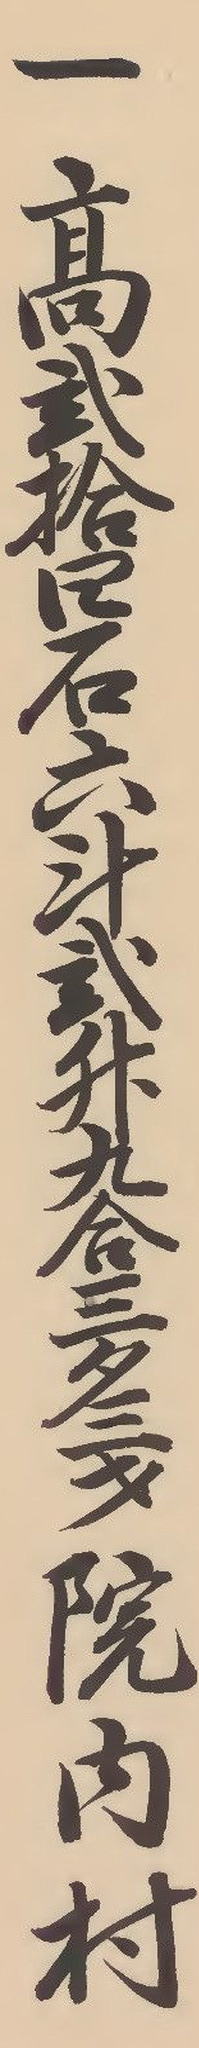一高弐拾四石六斗弐升九合三勺三才院内村

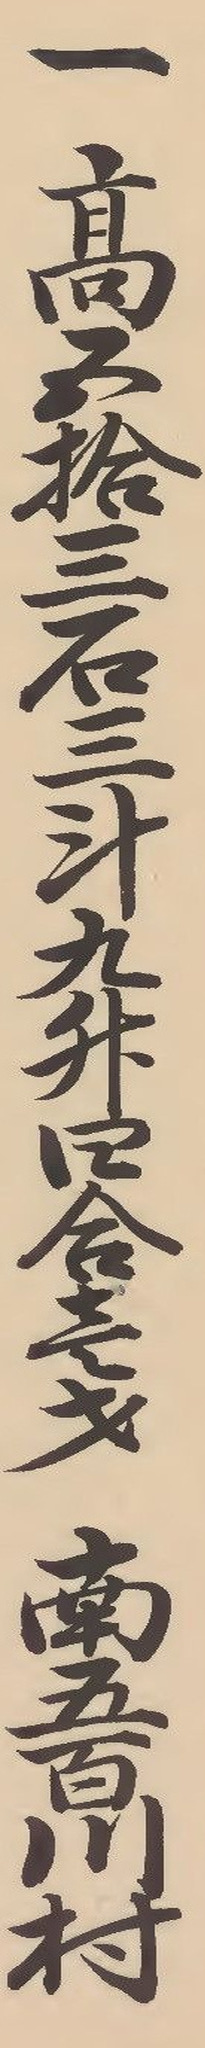一高五拾三石三斗九升四合壱才南五百川村
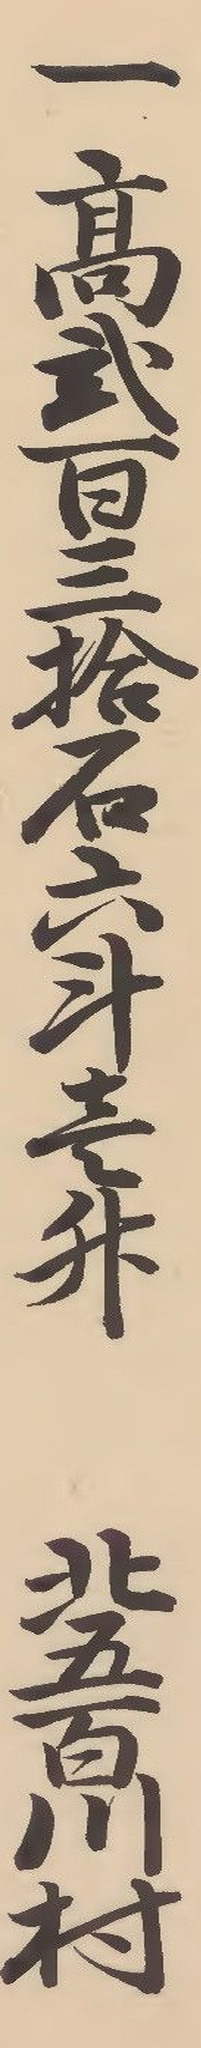一高弐百三拾石六斗壱升北五百川村
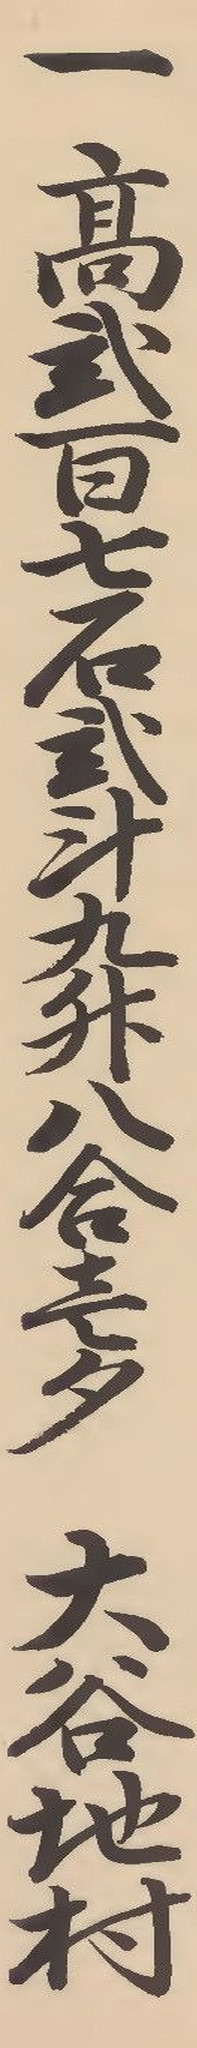一高弐百七石弐斗九升八合壱勺大谷地村
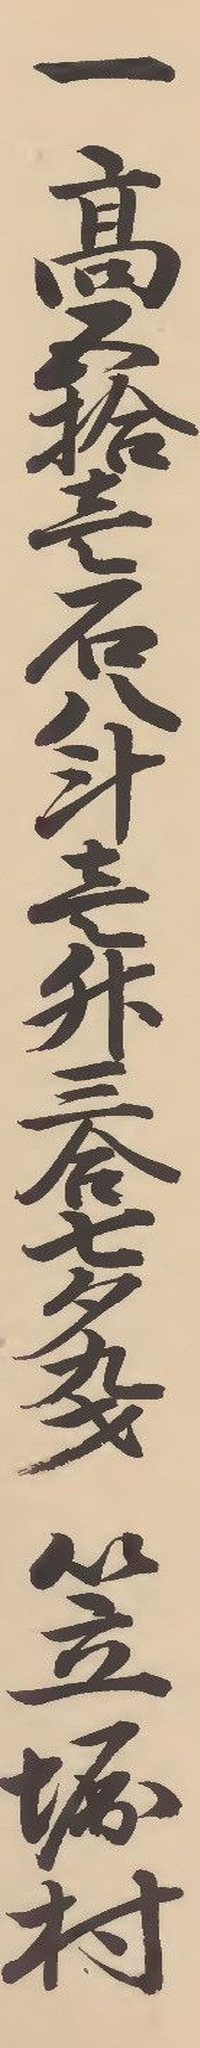一高五拾壱石八斗壱升三合七勺九才笠堀村
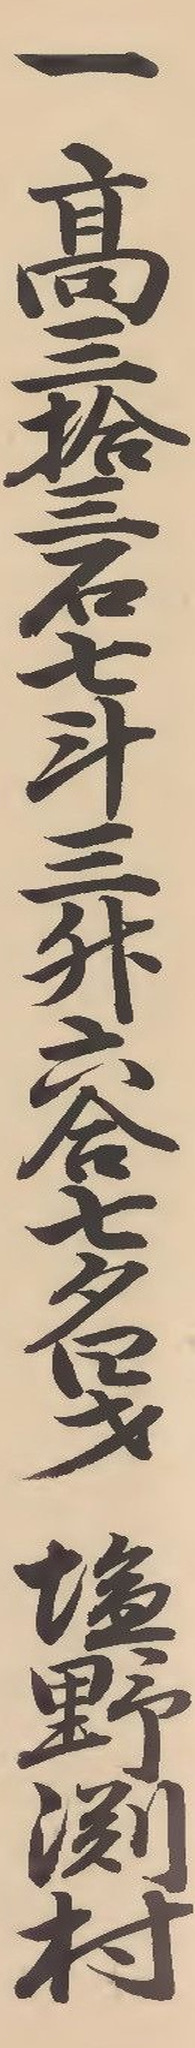一高三拾三石七斗三升六合七勺四才塩野淵村
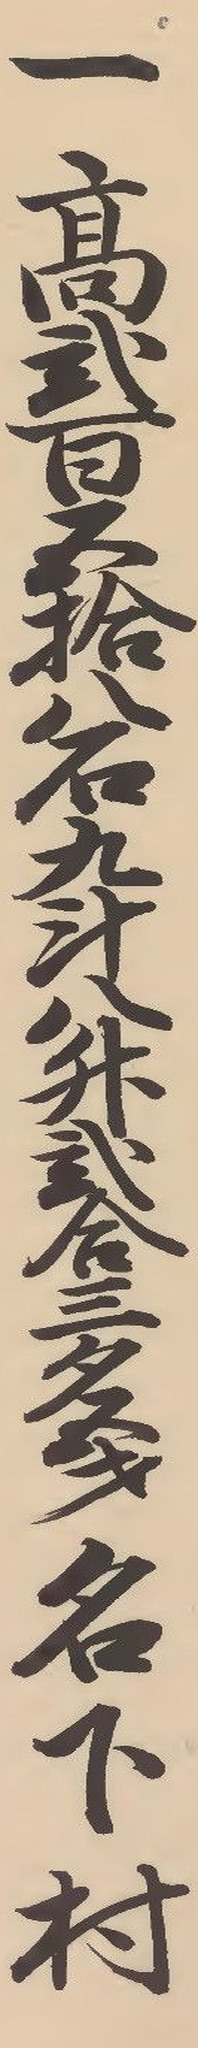一高弐百五拾八石九斗八升弐合三勺五才名下村
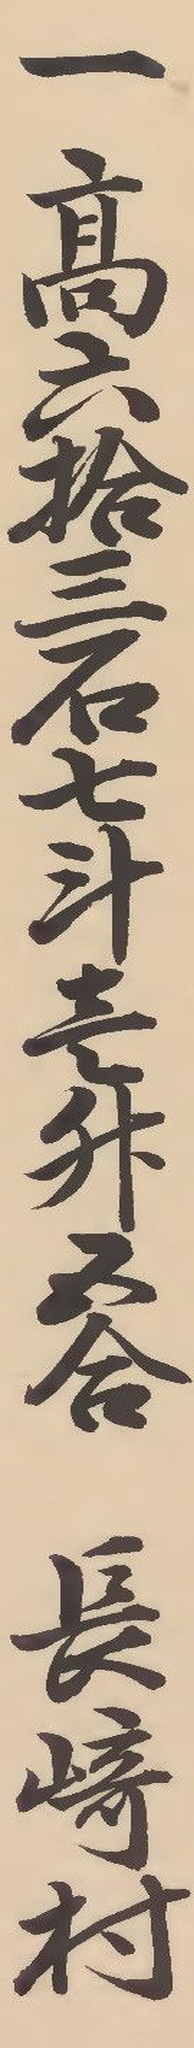一高六拾三石七斗壱升五合長崎村
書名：越後国郷帳　下
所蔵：国立公文書館 National Archives of Japan
